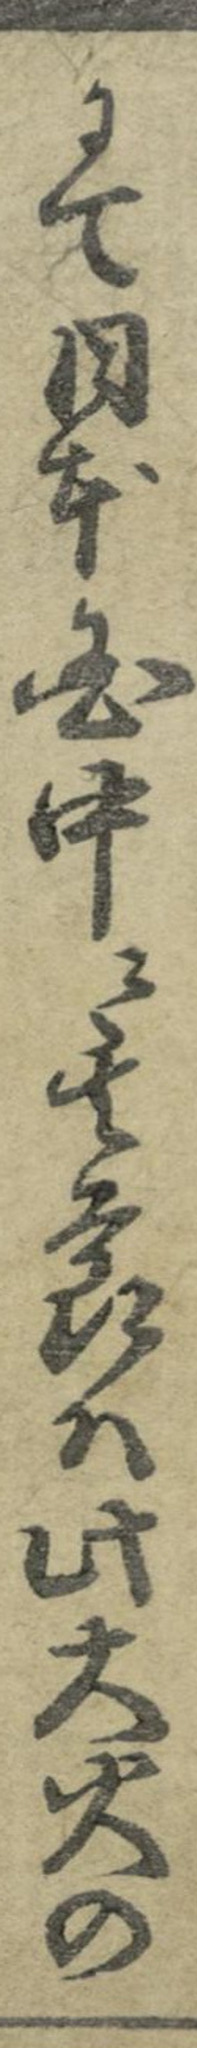にて日本国中に其節は此大火の
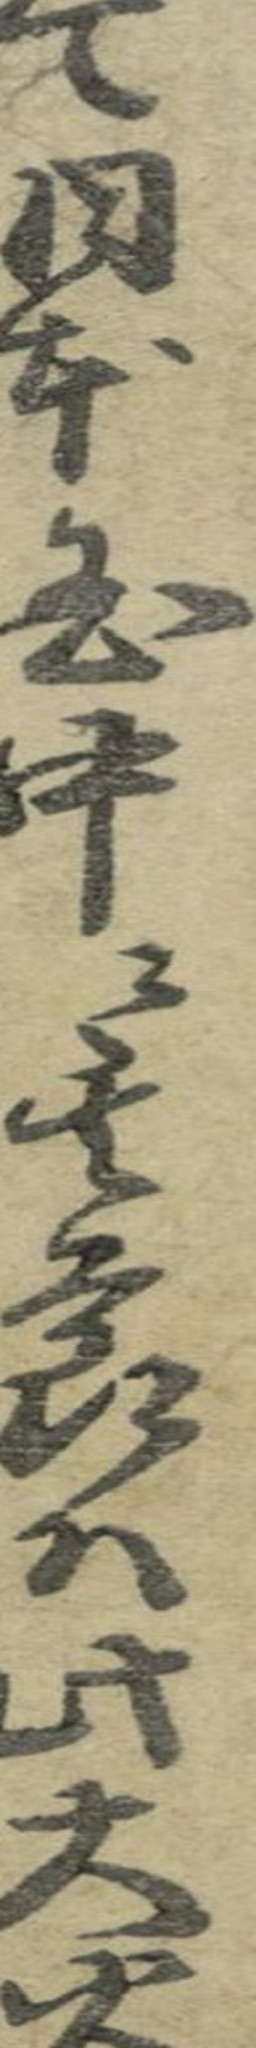にて日本国中に其節は此大火の
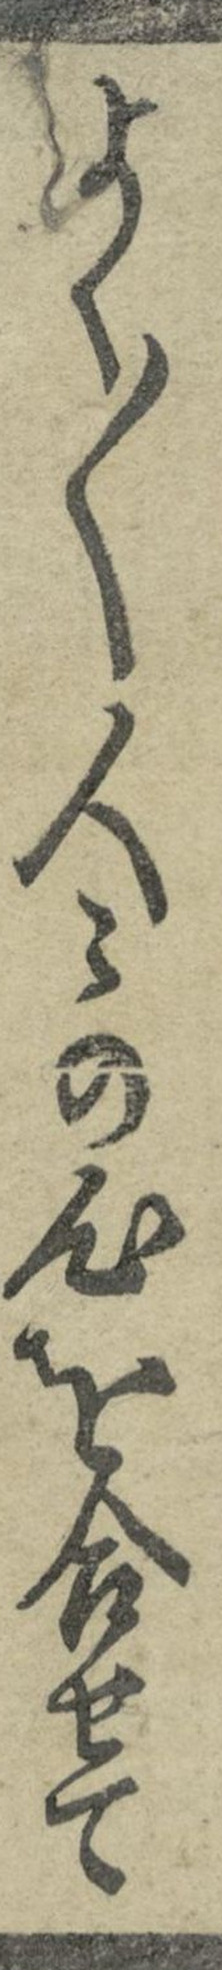よく〳〵人々の心を合せて
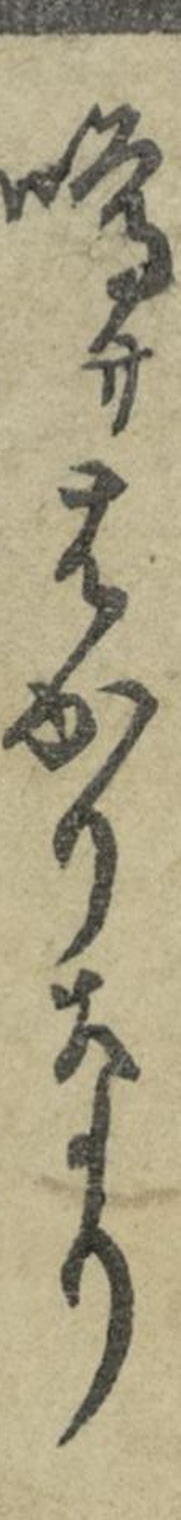噂サはかりなり
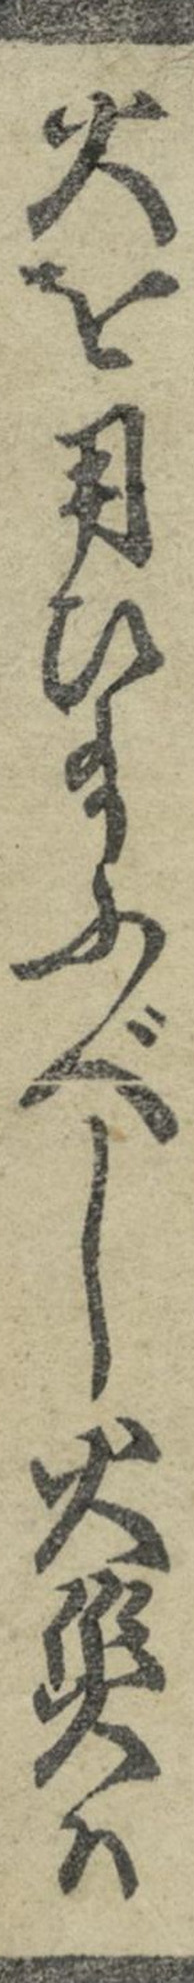火を用ひ給ふべし火災は
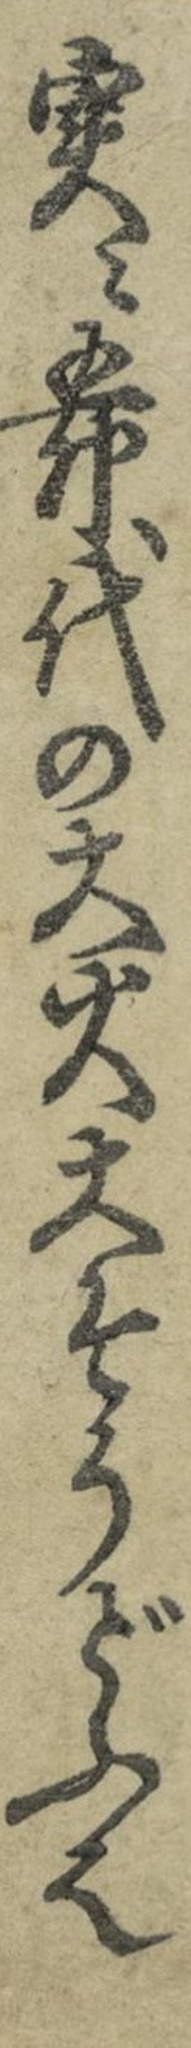実に希代の大火大そうどふ也
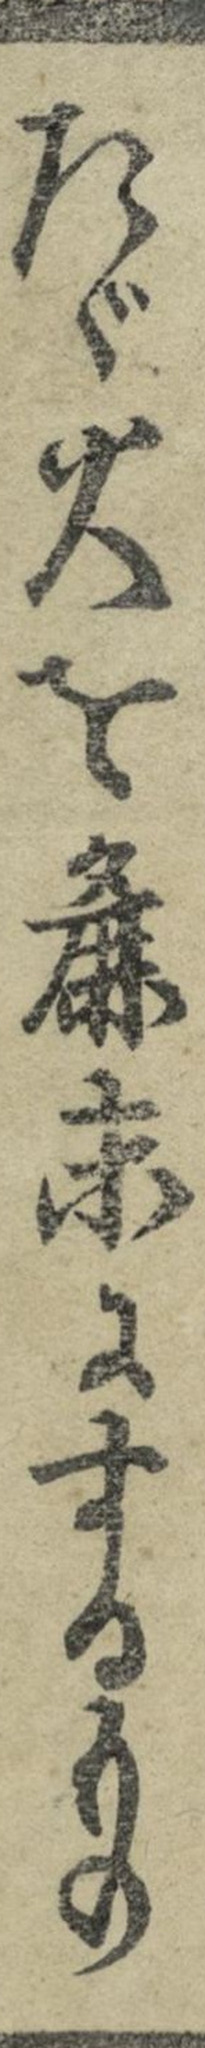たゞ火を麁末にするもの
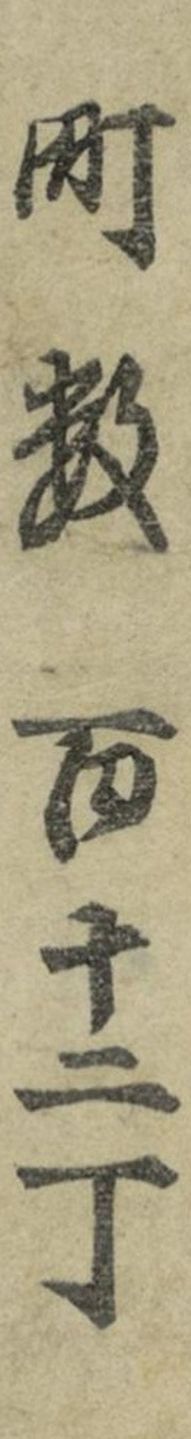町数百十二丁
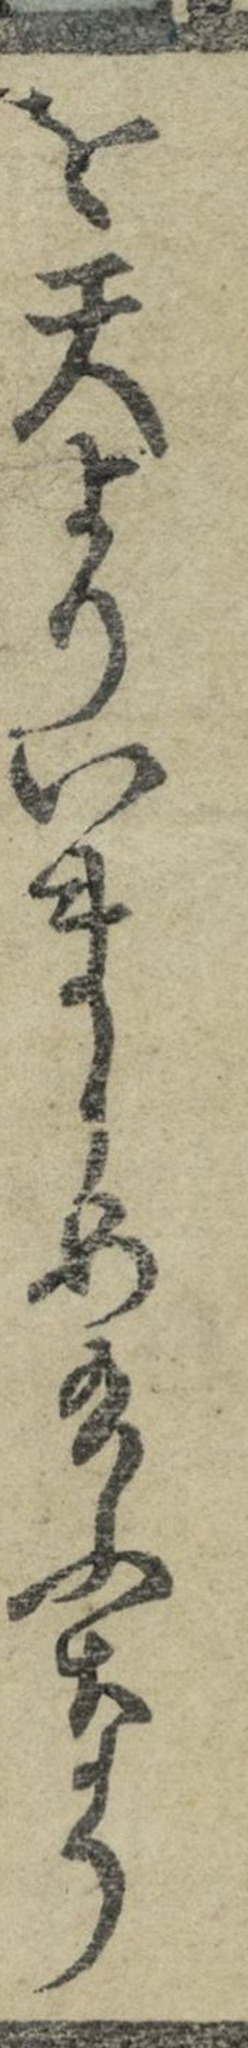を天よりいましめ給ふなり
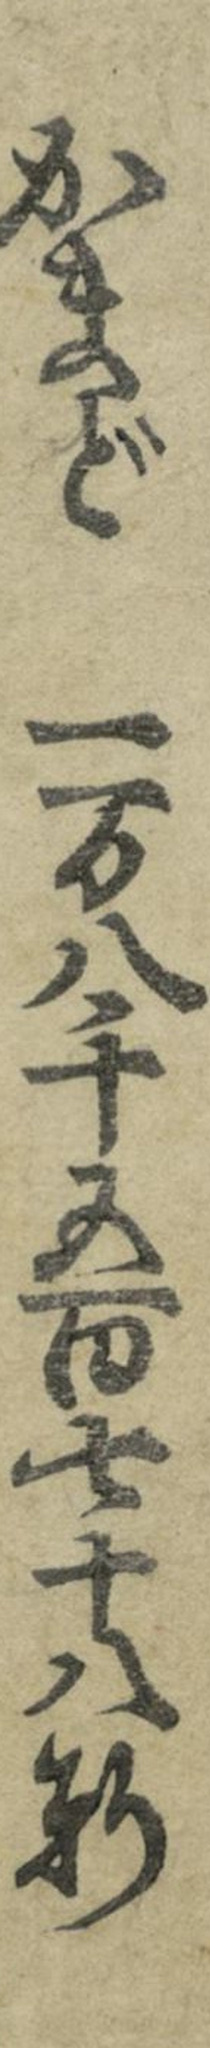かまど一万八千五百七十八軒
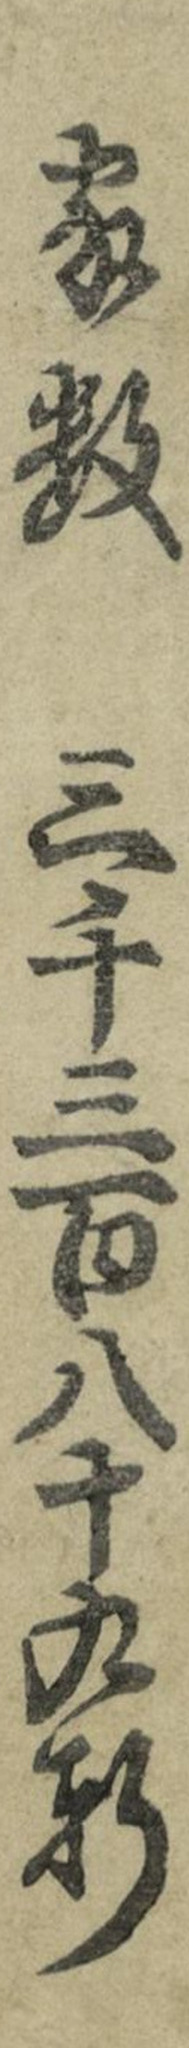家数三千三百八十九軒
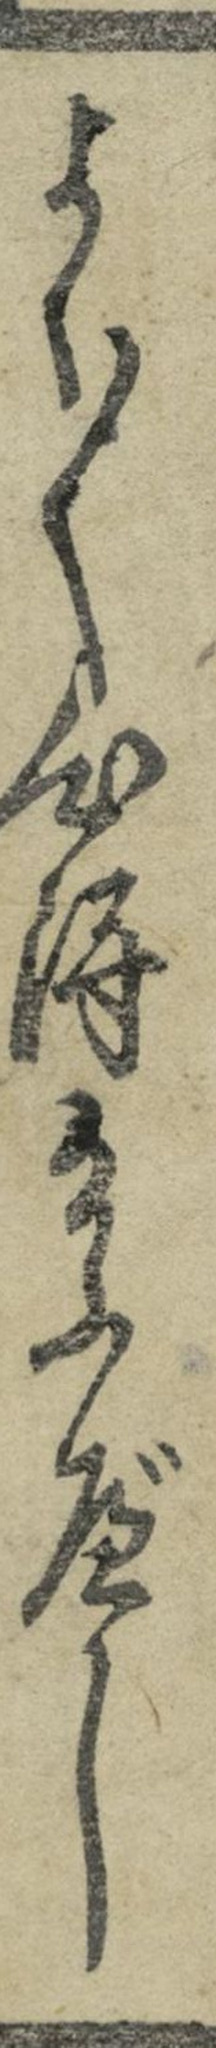よく〳〵心得給ふべし
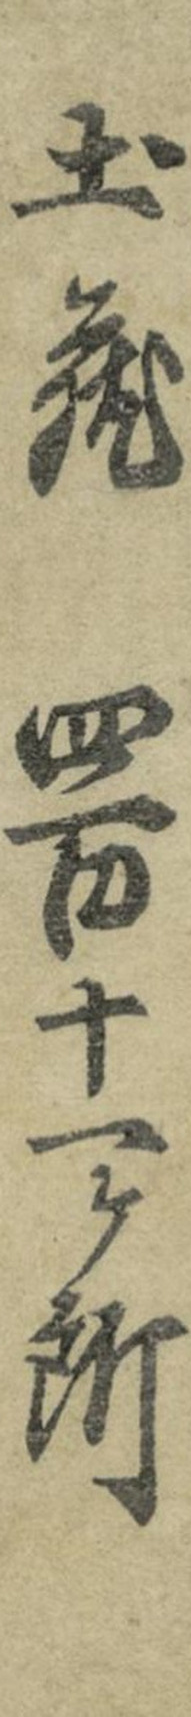土蔵四百十一ヶ所
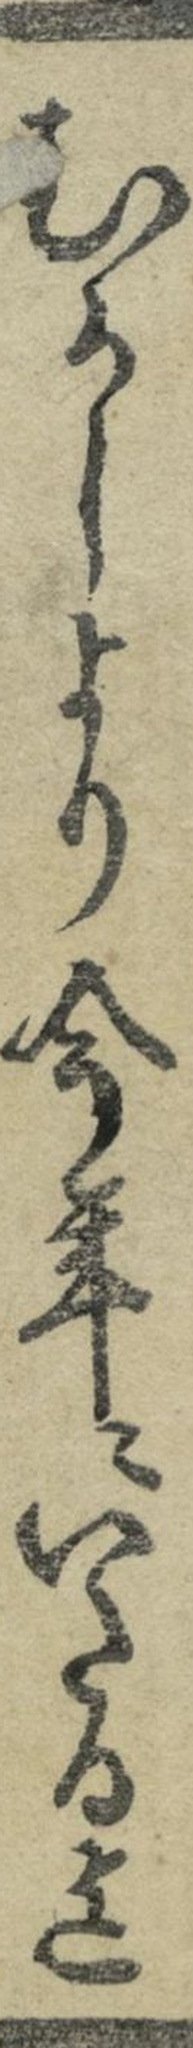むかしより今年にいたる迄
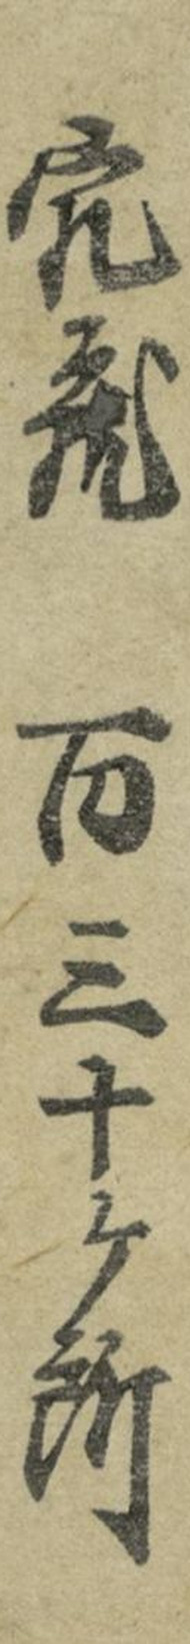穴蔵百三十ヶ所
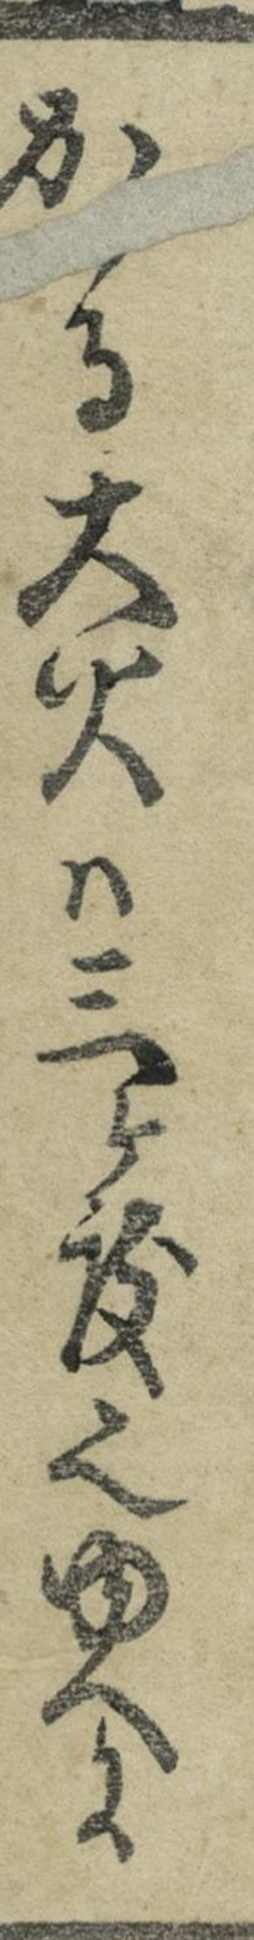かゝる大火は三ケ度也ゆへに
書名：大阪今昔三度の大火
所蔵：東京大学地震研究所図書室 Earthquake Research Institute Library, The University of Tokyo, JAPAN
